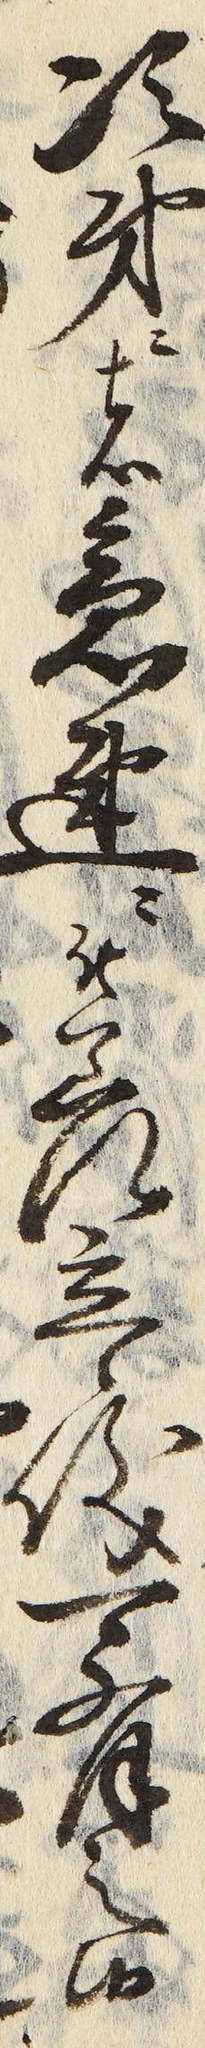次第ニ者急速ニ被差立候儀可有之候
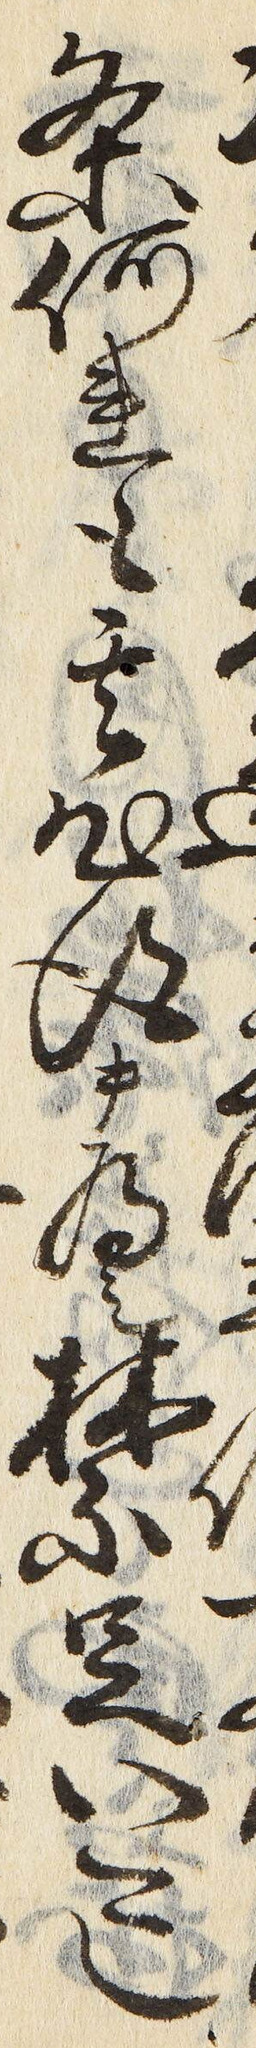条何れも其心得ヲ為シ禁足いたし
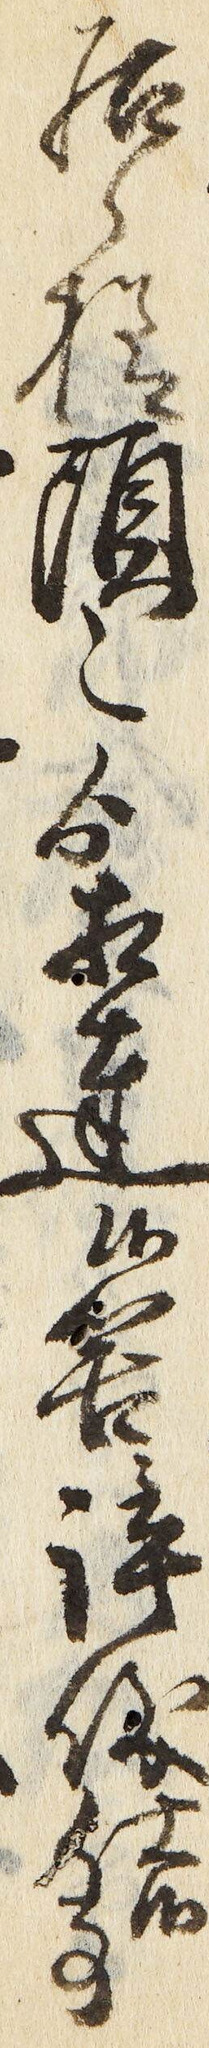居候様頭々ゟ相達候筈評儀仕候事
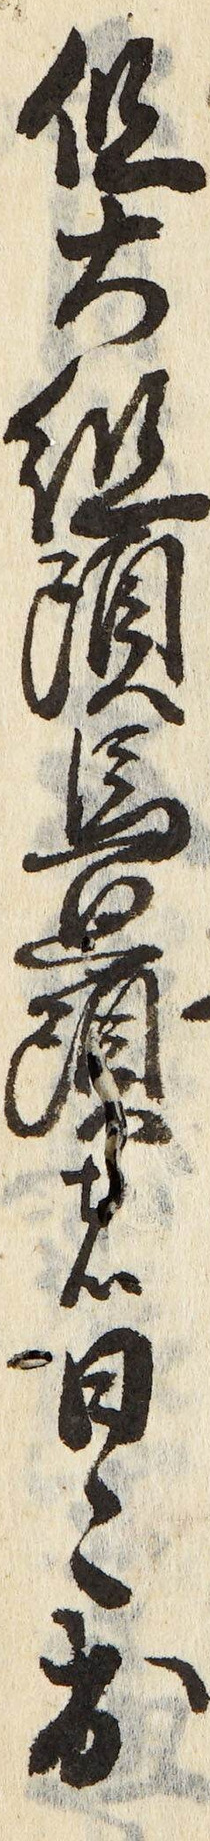但大組頭馬廻頭者日々出
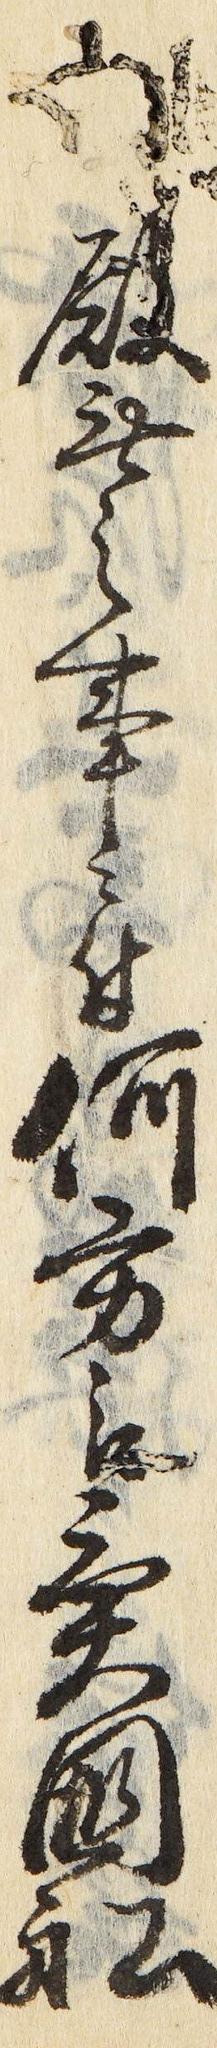殿無之事ニ付何方江異国船

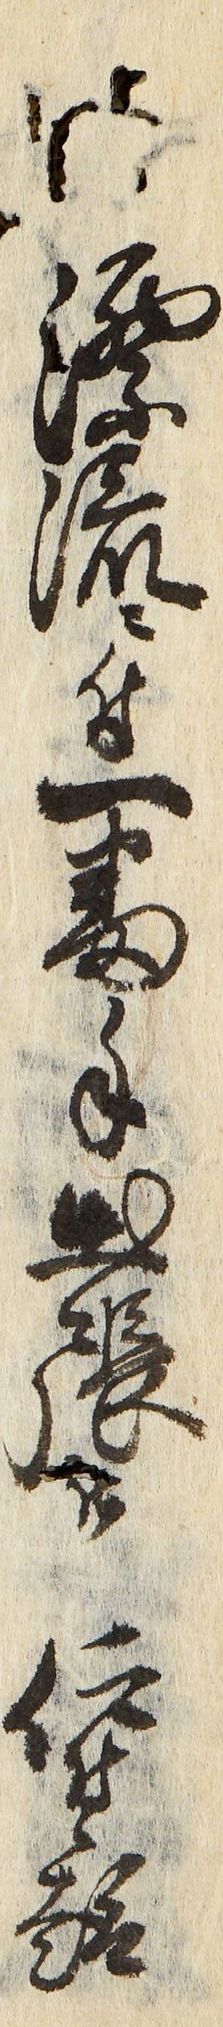漂流ニ付一番手出張被仰付候趣
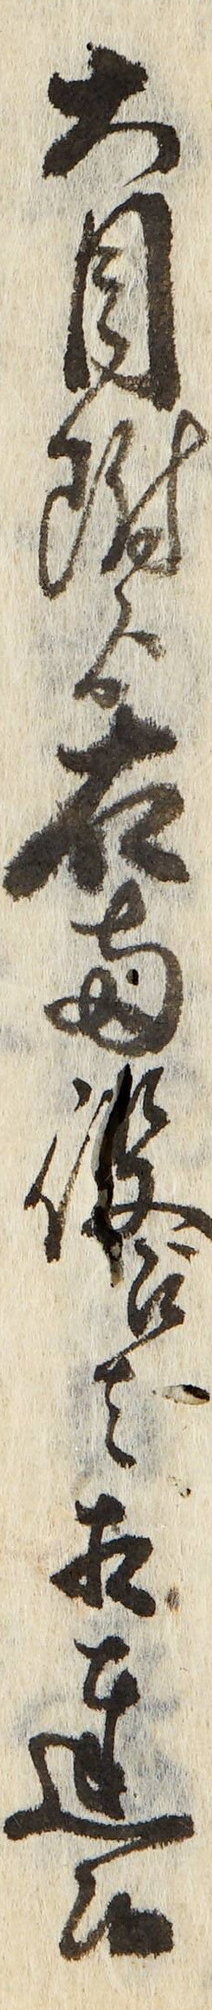大目付ゟ右両役江者相達候
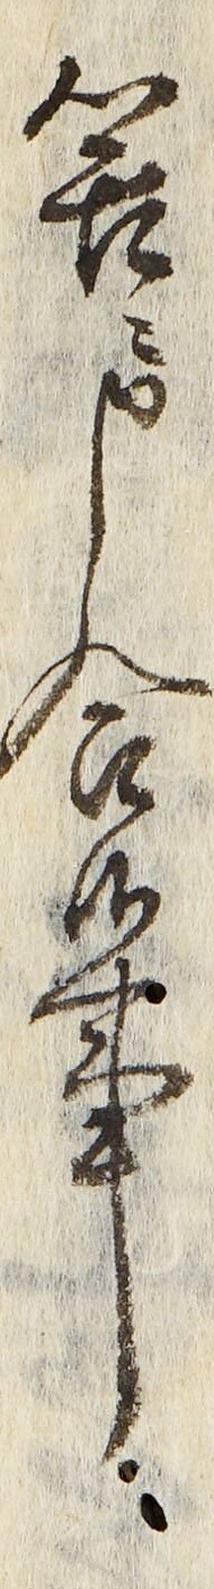筈ニ申合候事
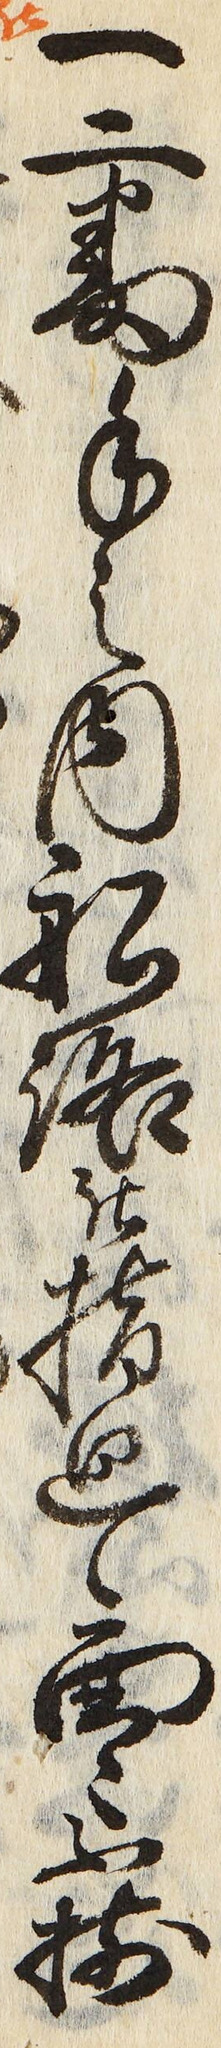一二番手之内船路被指廻候面々不残
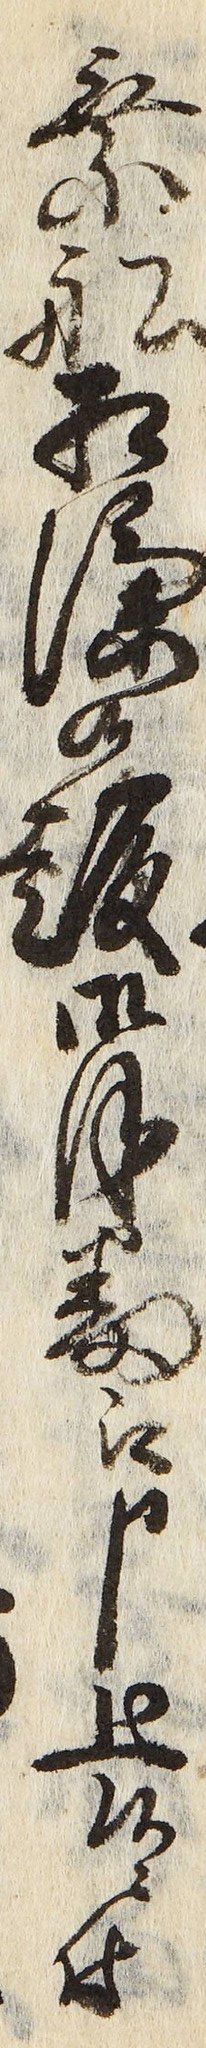乗船相済候趣御月番江申上候ニ付
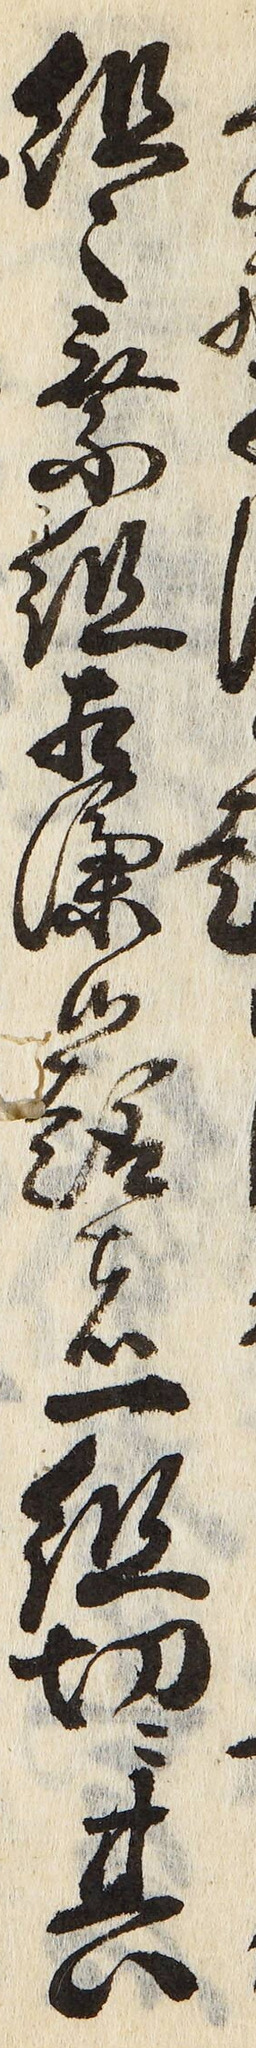組々乗組相済候趣者一組切ニ其
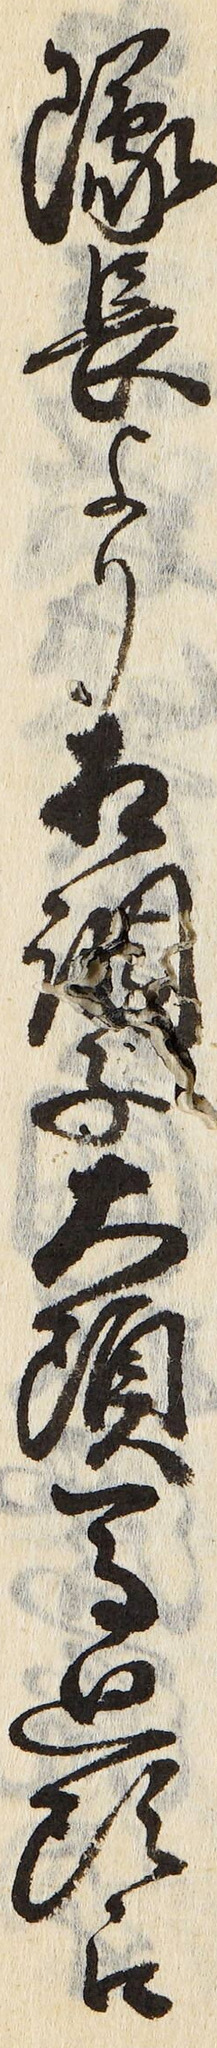隊長より相調子大頭馬廻頭江
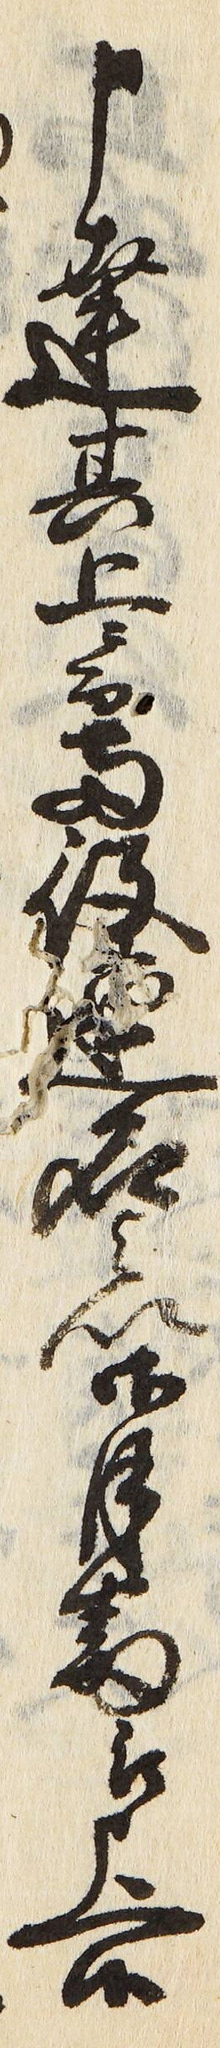申達其上ニ而両役連名与以御月番江申上候
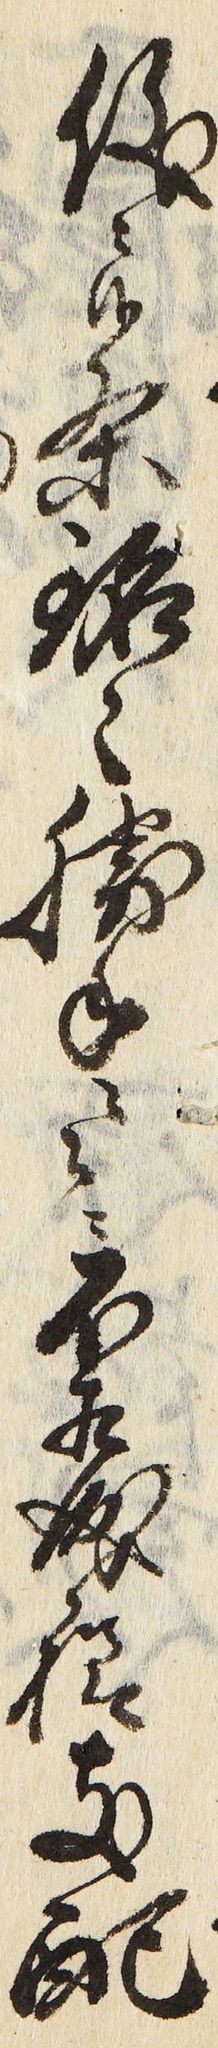儀ニ候条銘々勝手々々ニ不相成候様支配
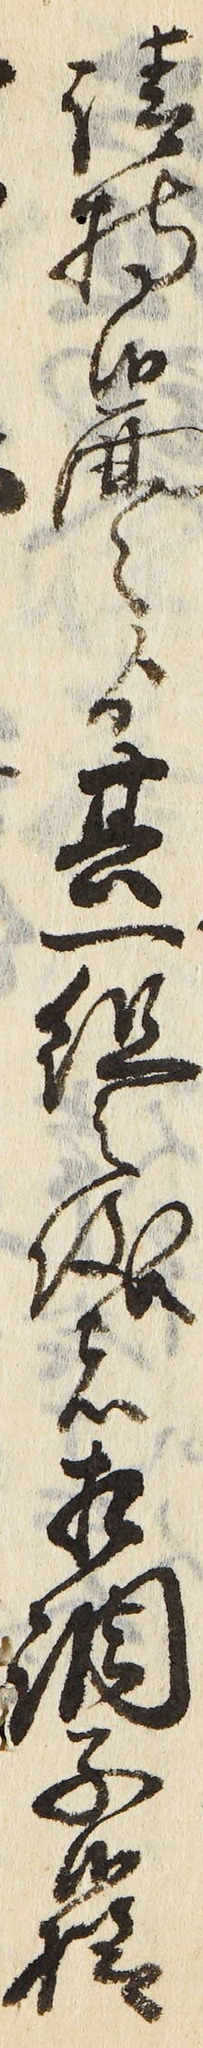請持候面々ゟ其一組之儀者相調子候様
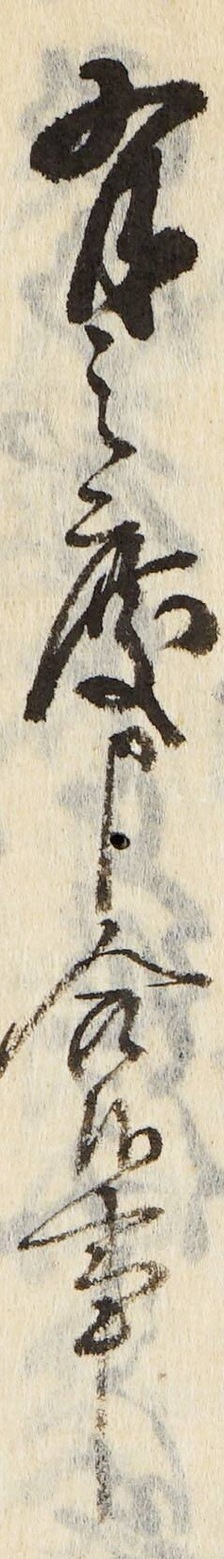有之度申合候事
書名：御領海江異国船漂流有之節御手当之次第大組頭心得之廉々書集記
